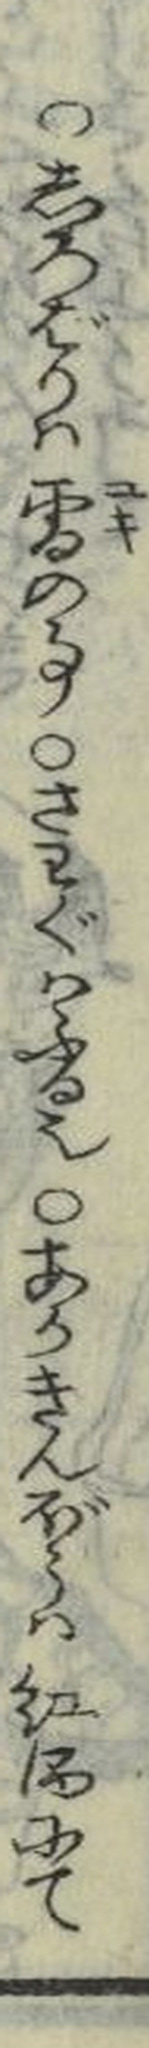〇しろばりハ雪の事〇さわぐハふる也〇あかきんぼうハ紅酒にて
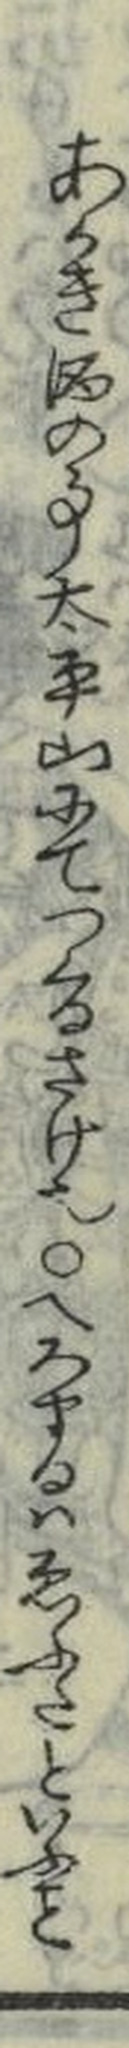あかき酒の事大平山にてつくるさけ也〇へろまるハゑふたといふこと
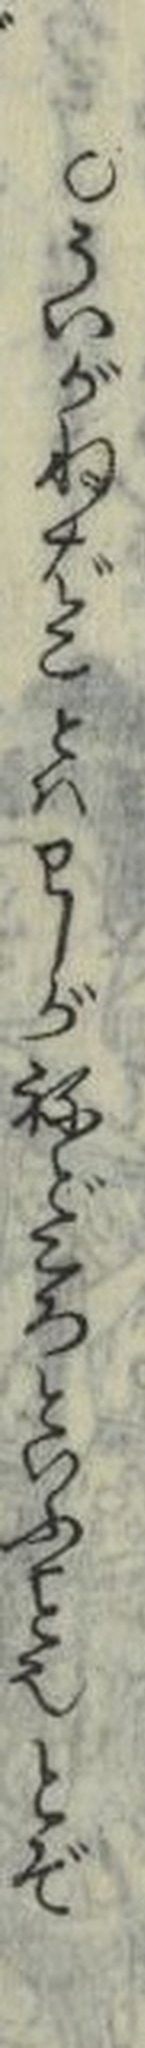〇ういがねばことハわしがねどころといふこと也とぞ
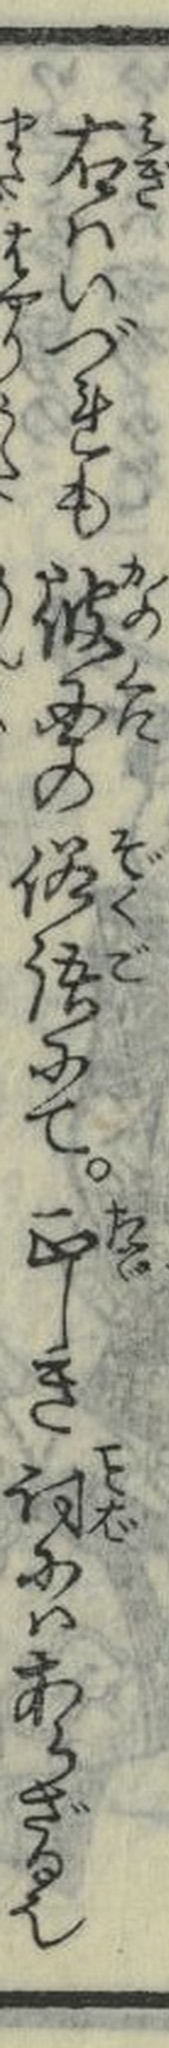右ハいづれも彼国の俗語にて。正しき詞にハあらざる也
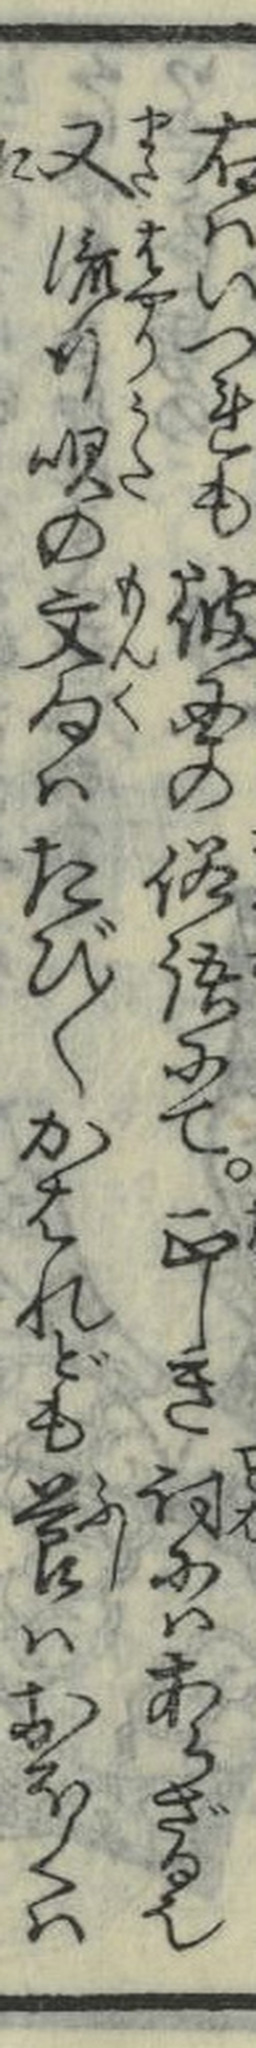又流行唄の文句ハたび〳〵かはれども節ハおほくハ
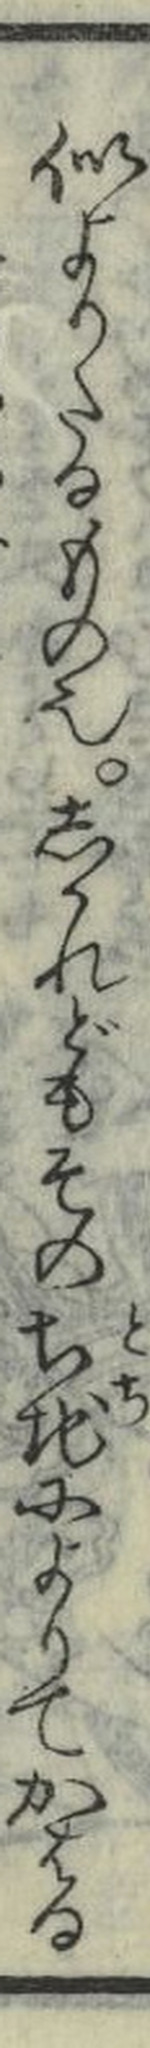似よりたるもの也。しかれどもその土地によりてかはる
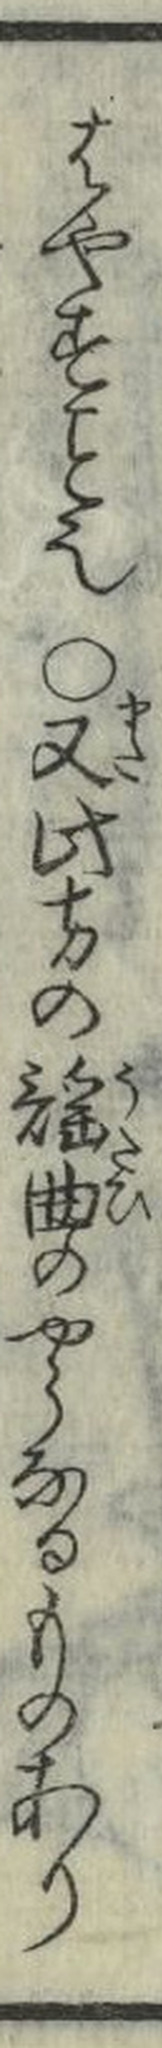はやすこと也〇又此方の謡曲のやうなるものあり
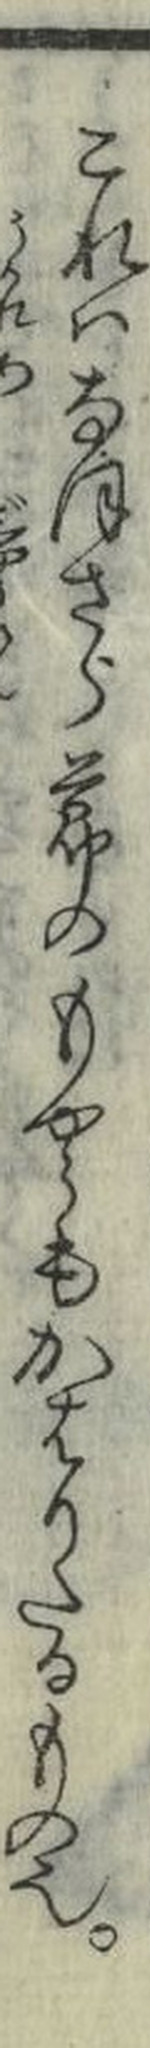これはなほさら節のもやうもかはりたるもの也。

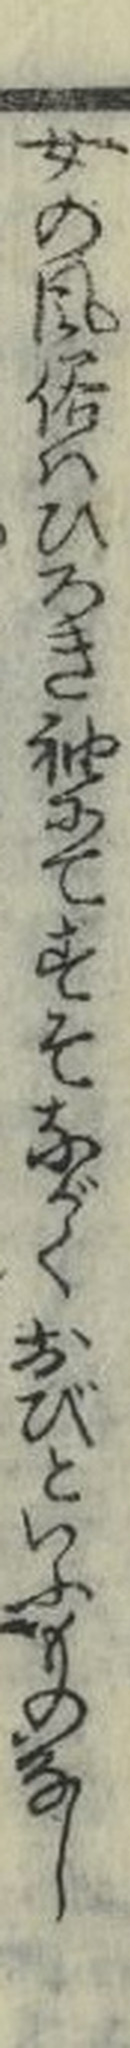女の風俗ハひろき袖にてすそながくおびといふものなし
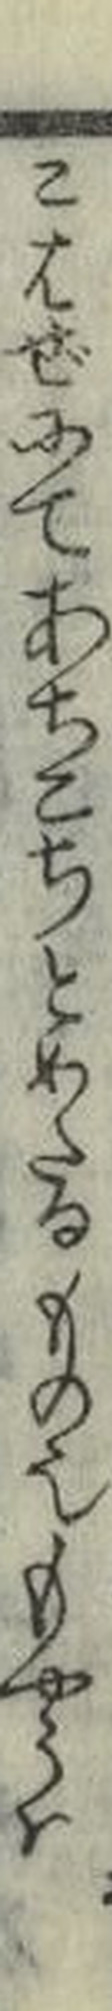こはぜにてあちこちとめたるもの也もやうハ
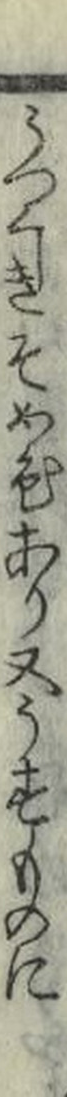うつくしきそめ色あり又うすものに
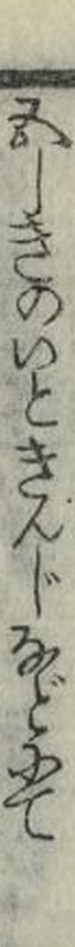五しきのいときんじなどにて
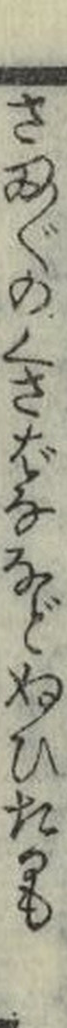さま〴〵のくさばななどぬひたるも
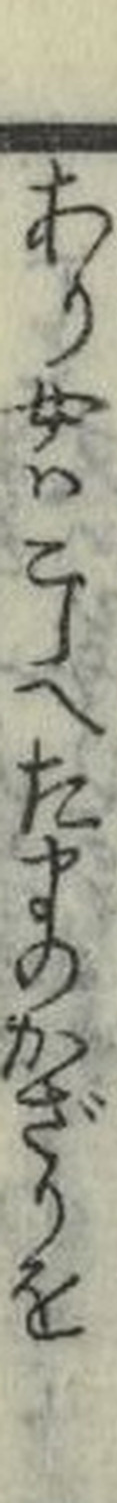あり女はこしへたまのかぎりを
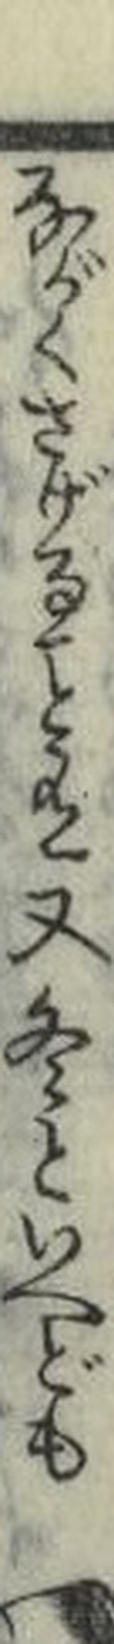ながくさげること有又冬といへども
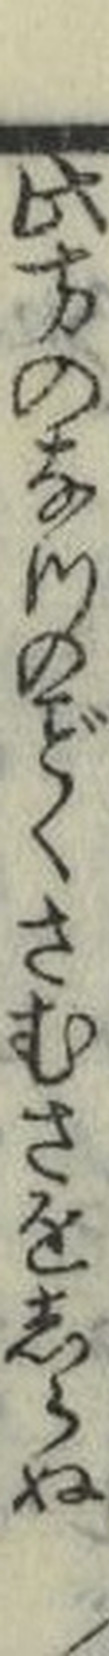此方のなつのごとくさむさをしらぬ
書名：琉球奇譚
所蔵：University of the Ryukyus Library
